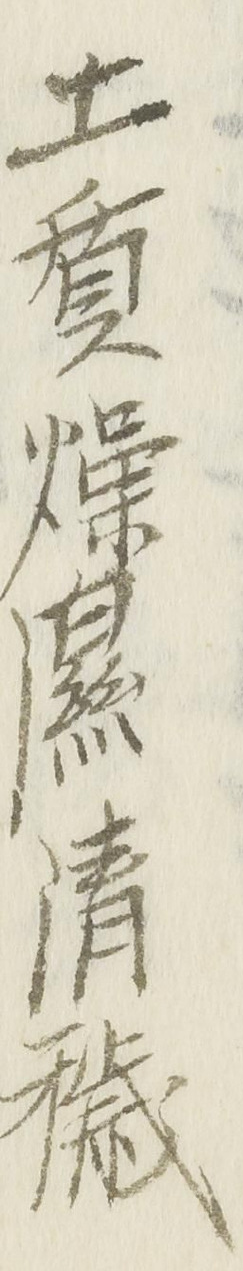土質燥湿清穢
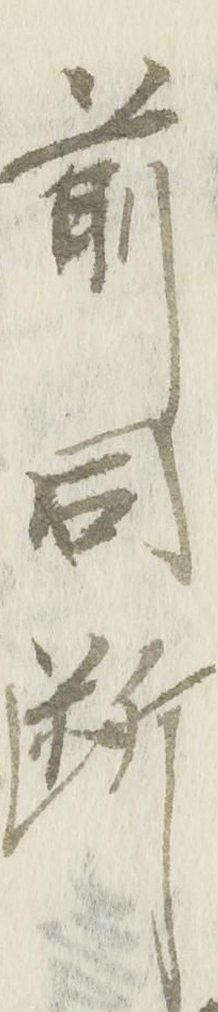前同断
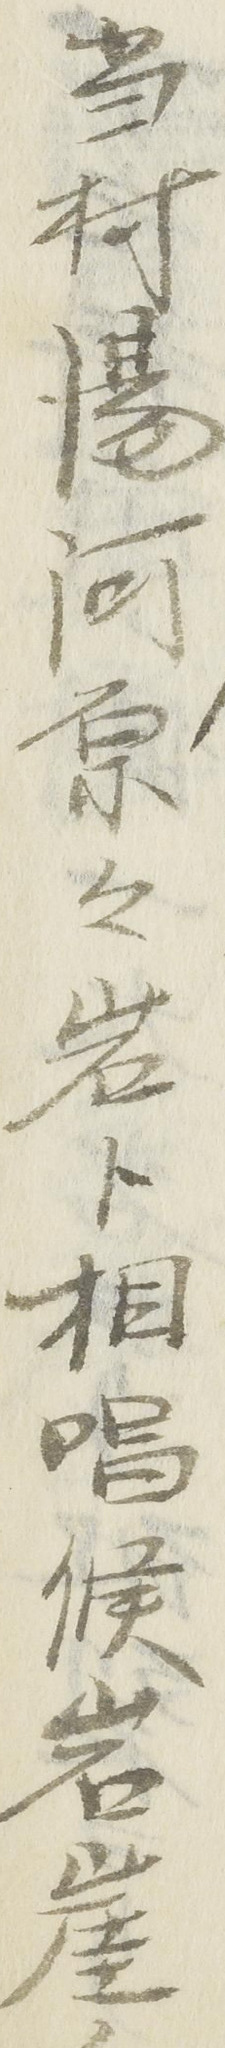当村湯河原々岩ト相唱候岩崖ノ

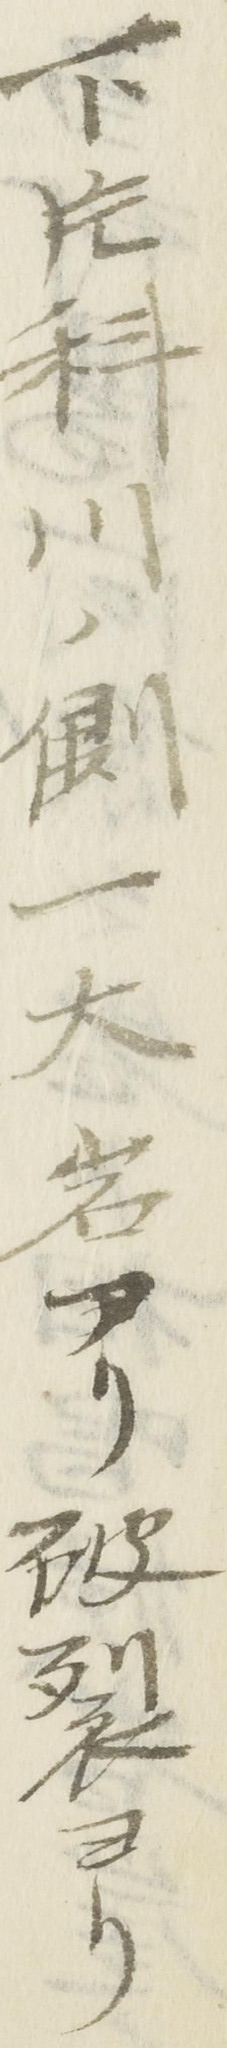下片科川側一大岩アリ破裂ヨリ
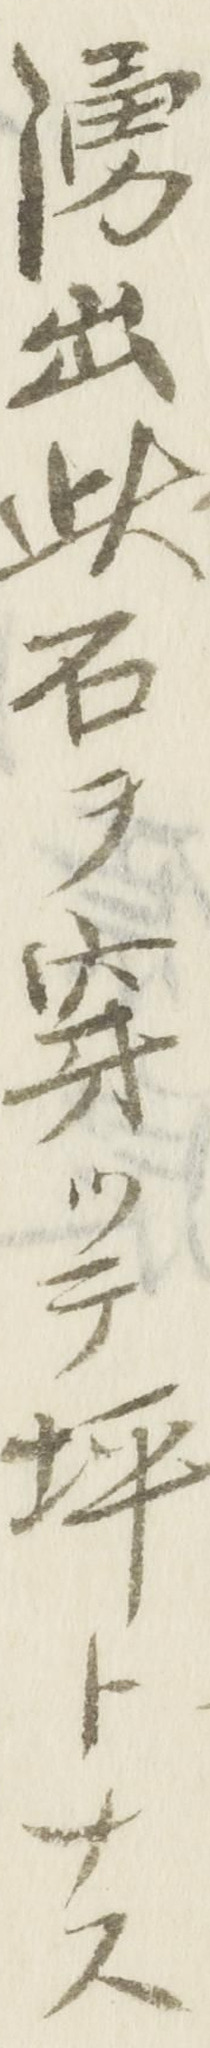湧出此石を穿ツテ坪トナス
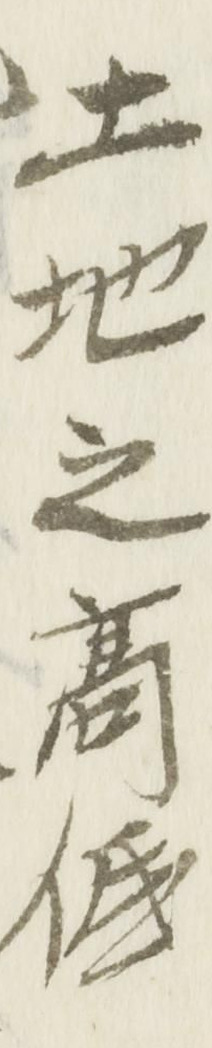土地之高低
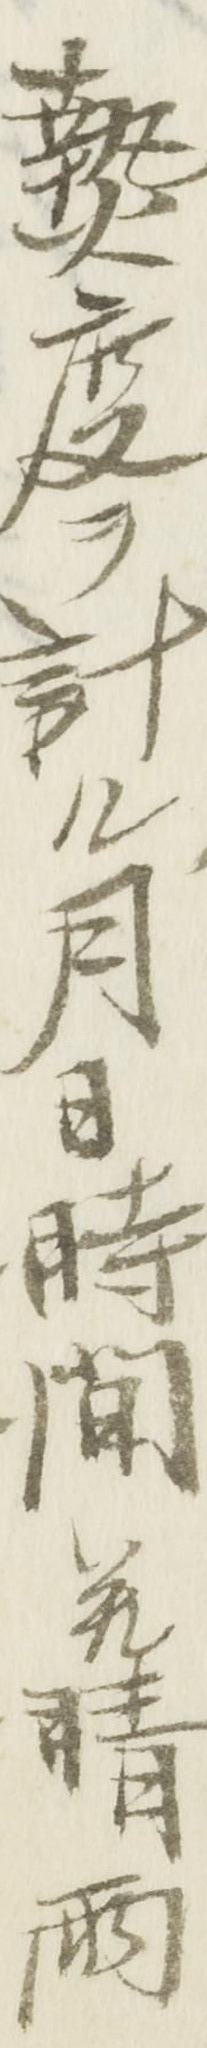熱度ヲ計ル月日時間幷晴雨
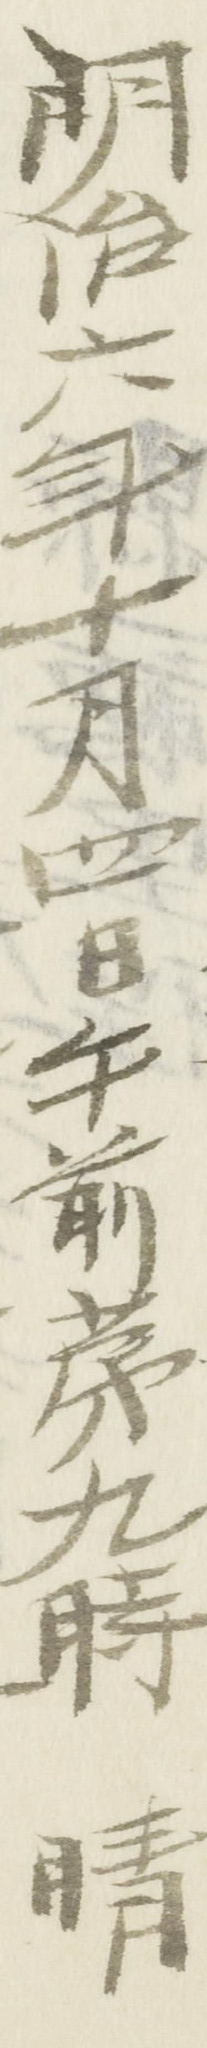明治六年十月四日午前第九時晴
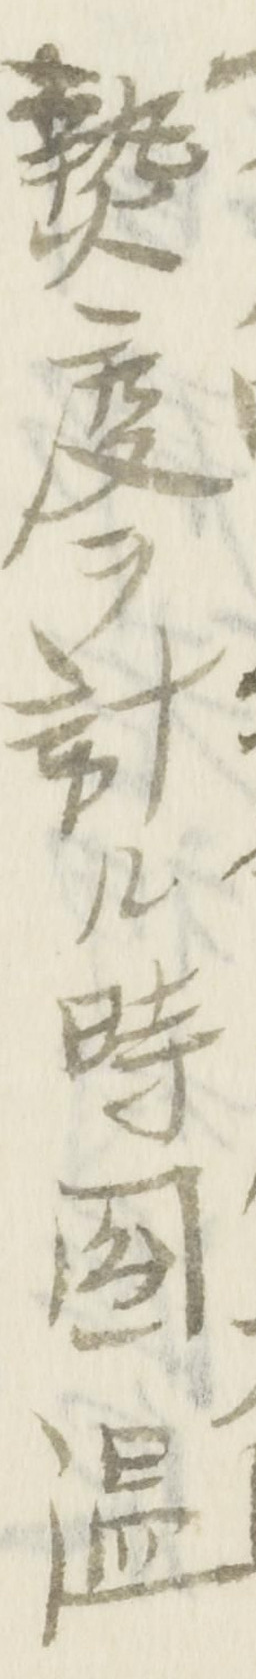熱度ヲ計ル時分温
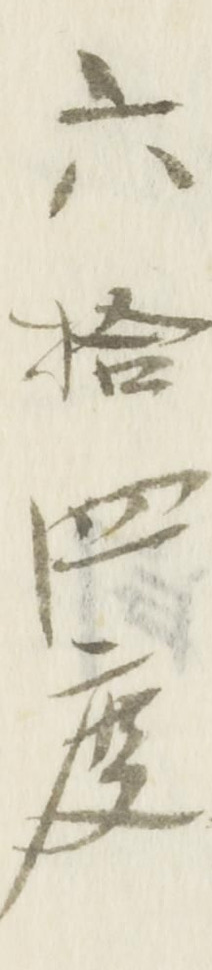六拾四度
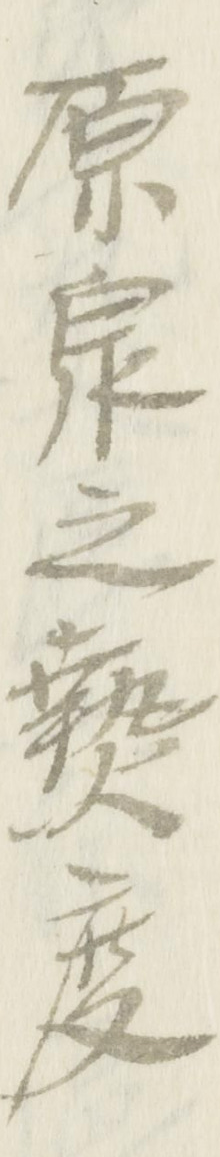原泉之熱度
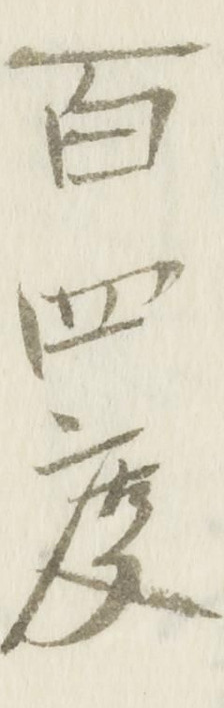百四度
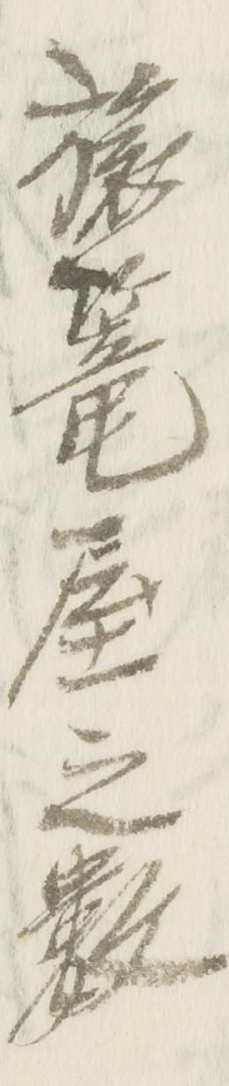旅籠屋之数
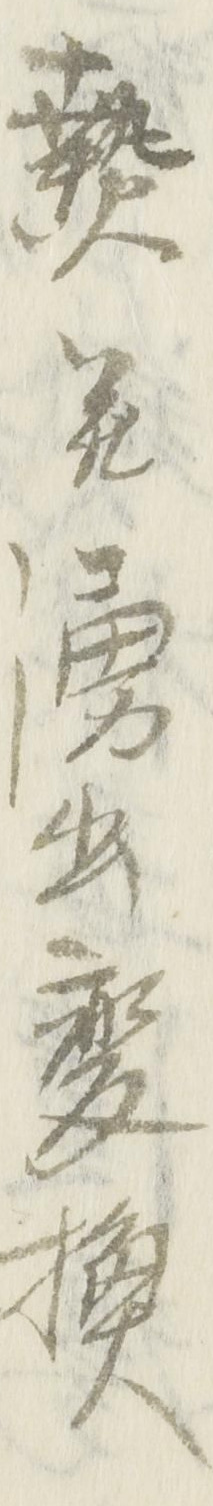熱并湧出変換
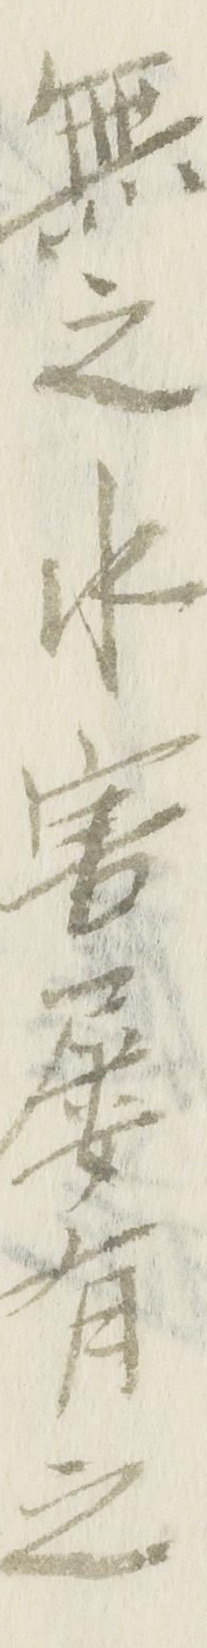無之水害屡有之
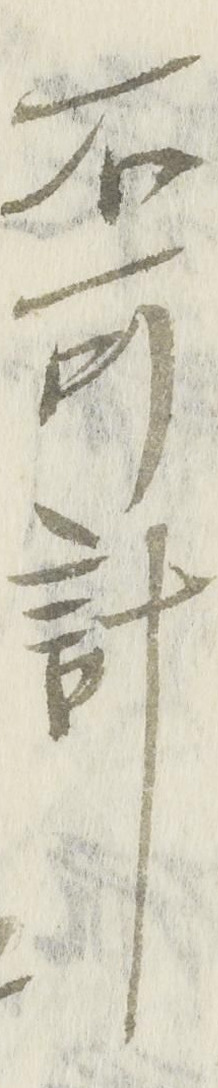不可計
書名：温冷泉試験表
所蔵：東京大学地震研究所図書室 Earthquake Research Institute Library, The University of Tokyo, JAPAN
